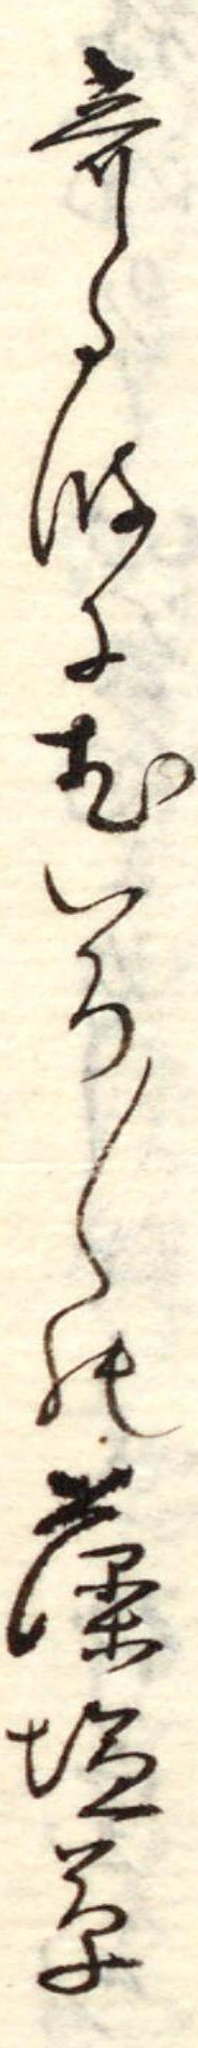寄る波に尤いろ〳〵の藻塩草
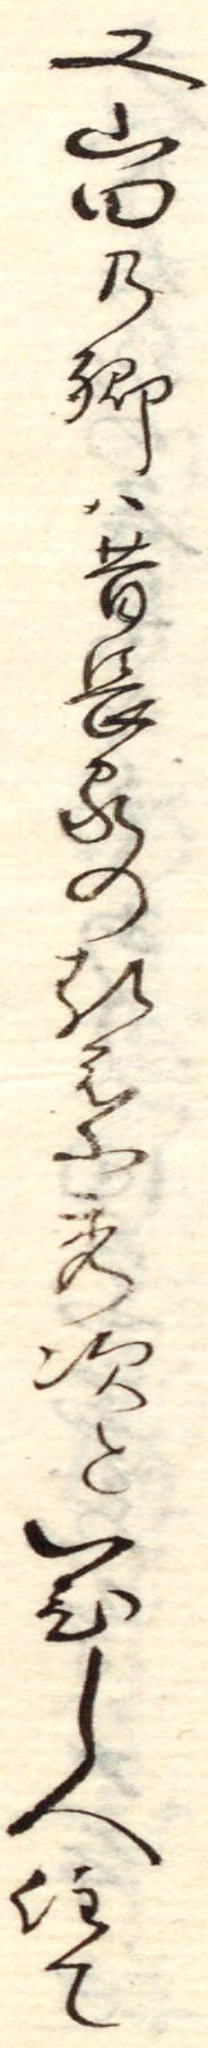又山田の郷昔長家の類葉秀次といひし人住て
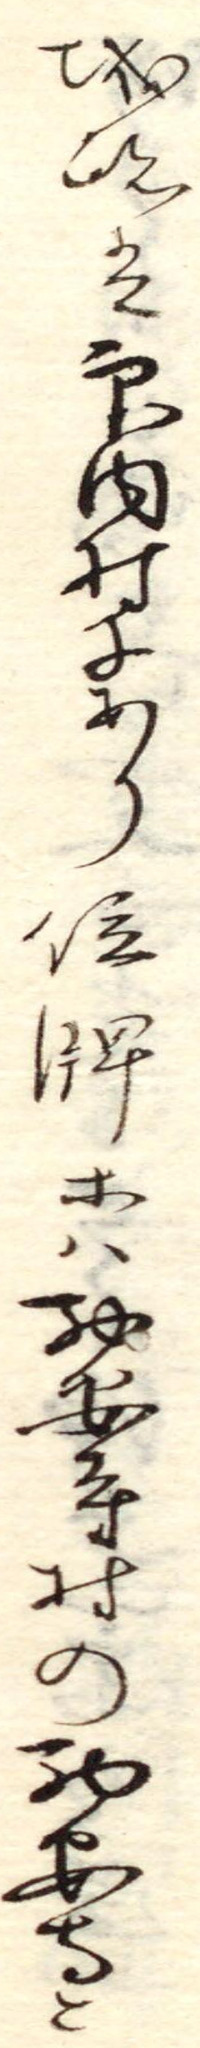城跡は印内村にあり位牌等は西安寺村の西安寺と
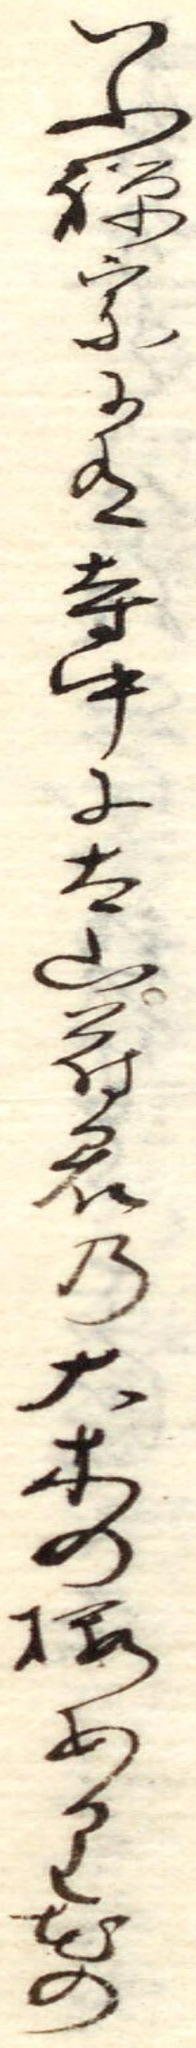いふ禅宗に有寺中に太山府君の大木の桜あり花の
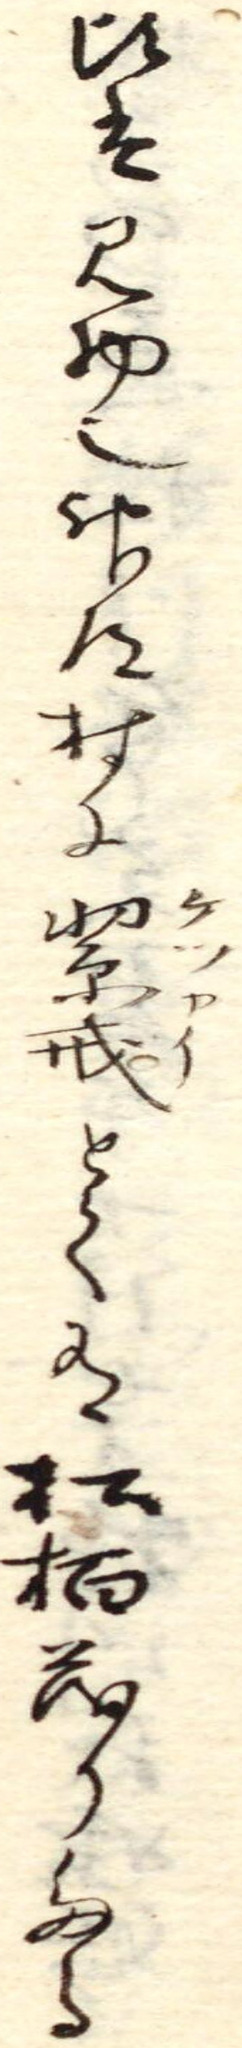頃は見物也神道村に絜戒とて有松栢茂りたる
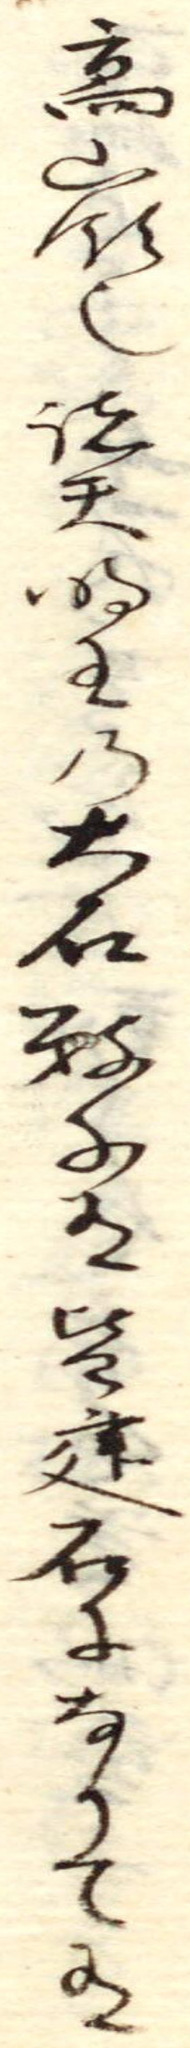高山領也諸天明王の大石数千有皆建石になりて有
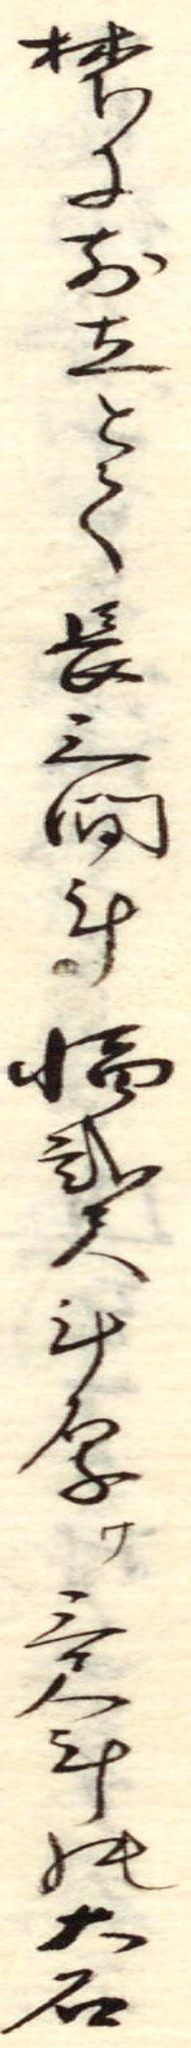梺に前立とて長三間斗幅弐尺斗厚さ三尺斗の大石
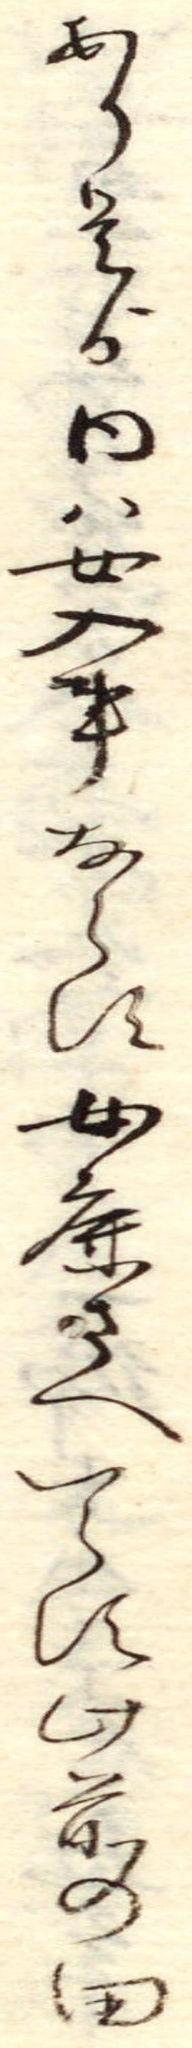あり是ゟ内は女入事ならす女鹿さへいらす此前の田
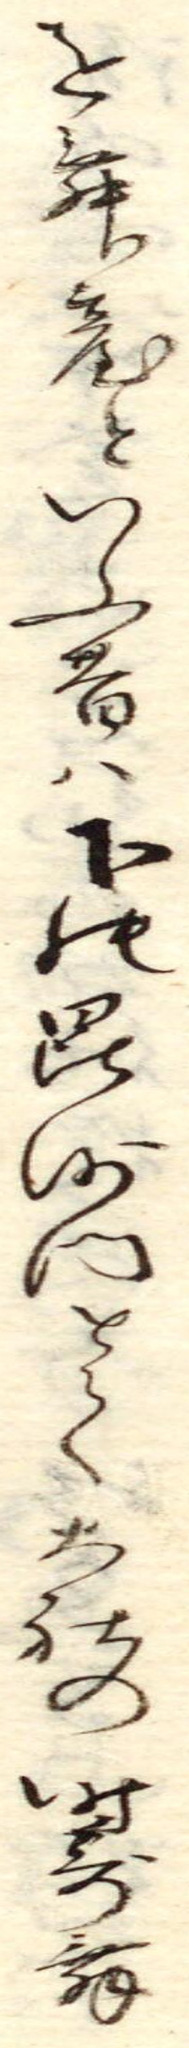を舞台といふ昔は下の毘沙門とて大社の時寄舞
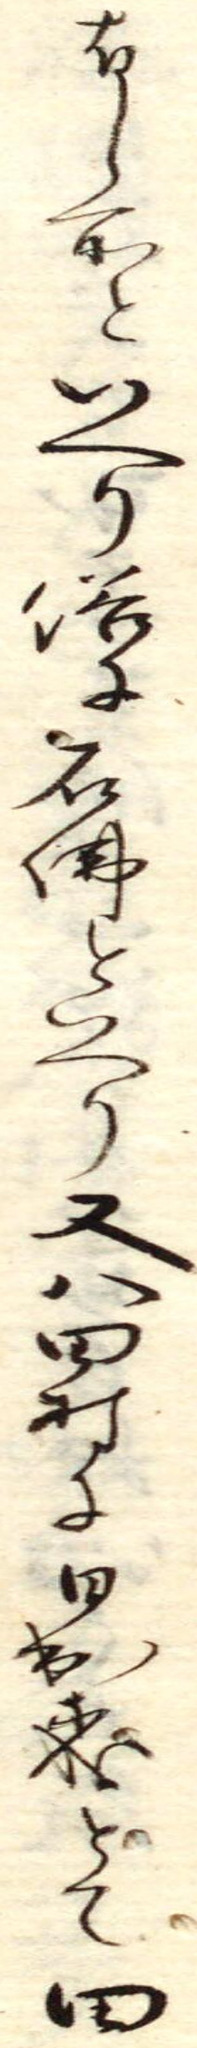有し所といへり俗に石仏といへり又八田村に日出森とて田
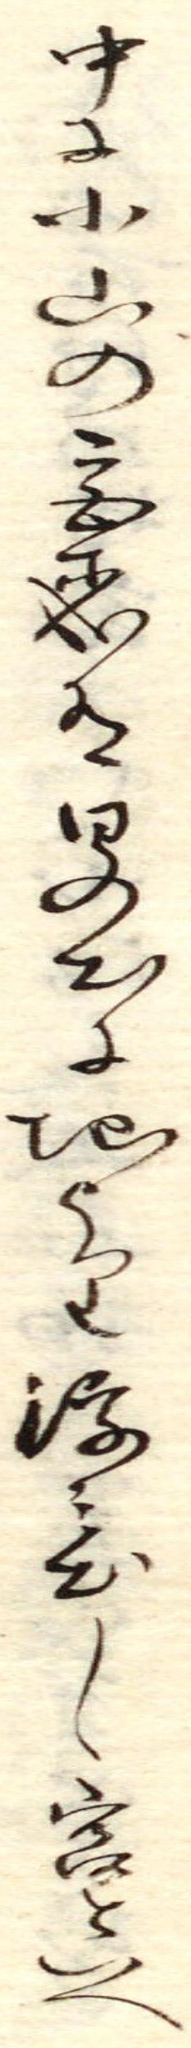中に小山の宮森有日の出に地より浮出し宮といへ
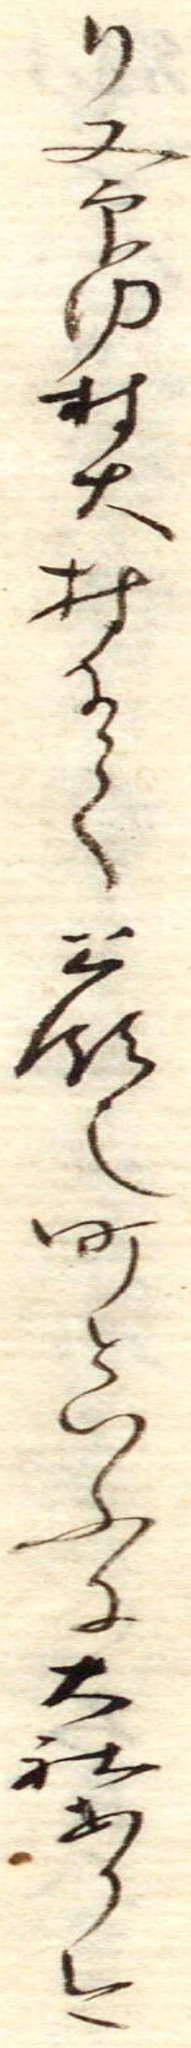り又印内村大村にて公領也町といふに大社あり今
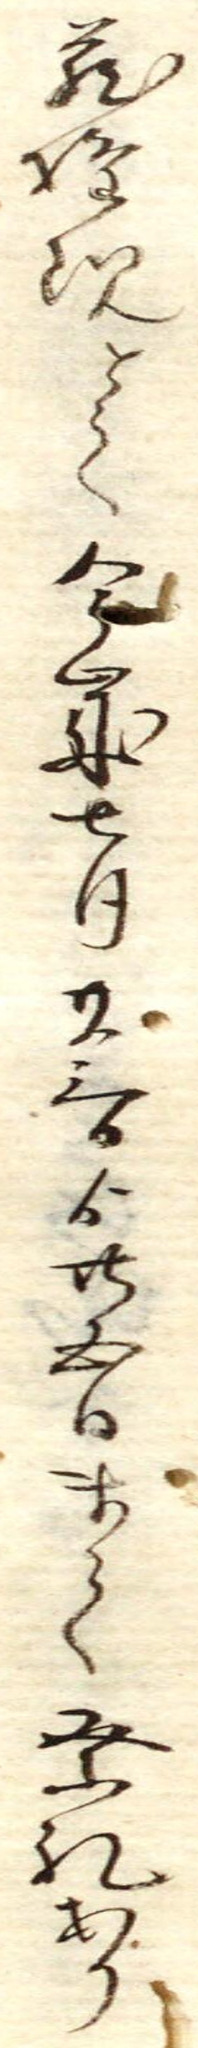蔵権現とて今歳七月廿三日ゟ廿五日ままて祭礼あり
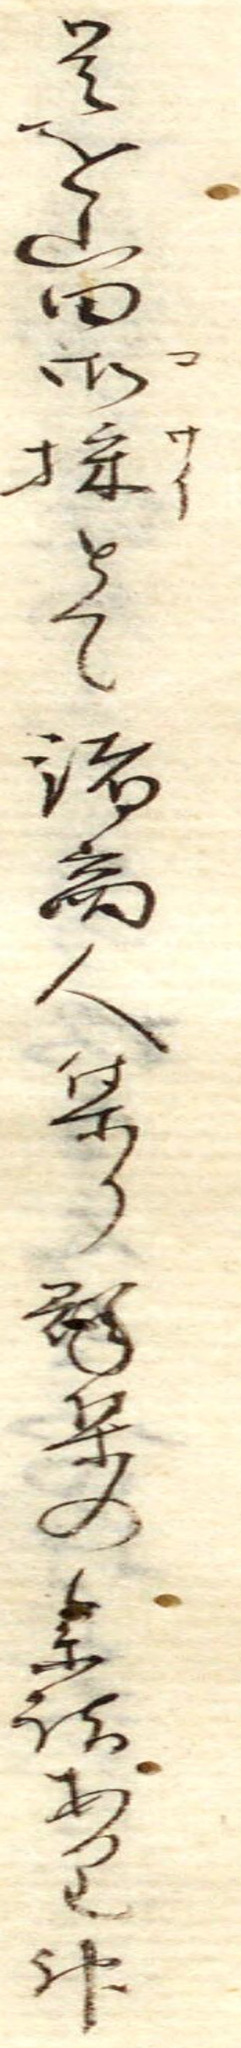是を山田御採とて諸商人集り群集の参詣あり神

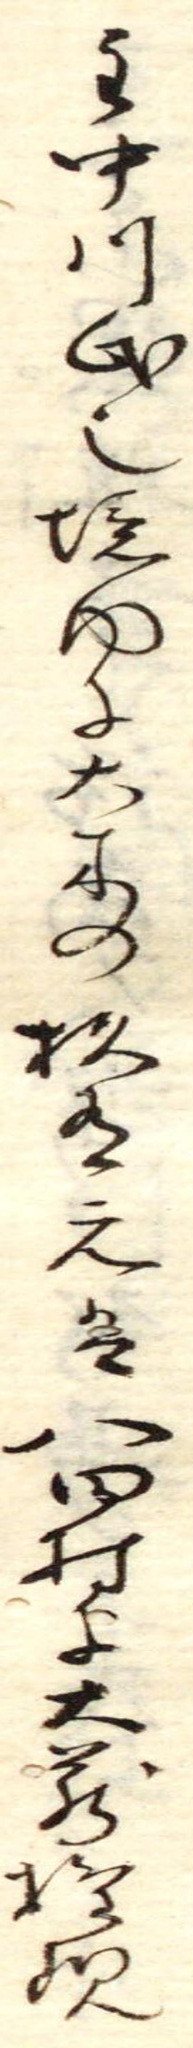主中川氏也境内に大木の杉有元は八田村に大蔵権現
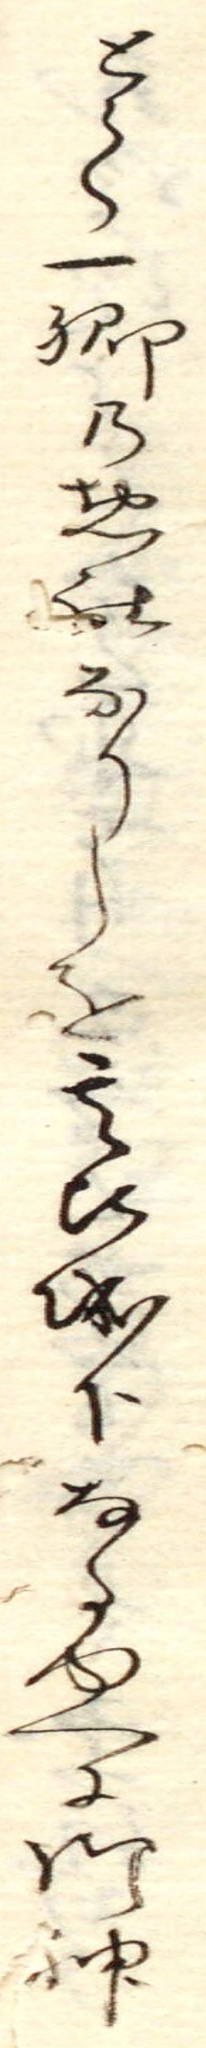とて一郷の惣社なりしを其頃城下なるゆへに御神
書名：能登名跡誌
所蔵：Ishikawa Prefectural Library
